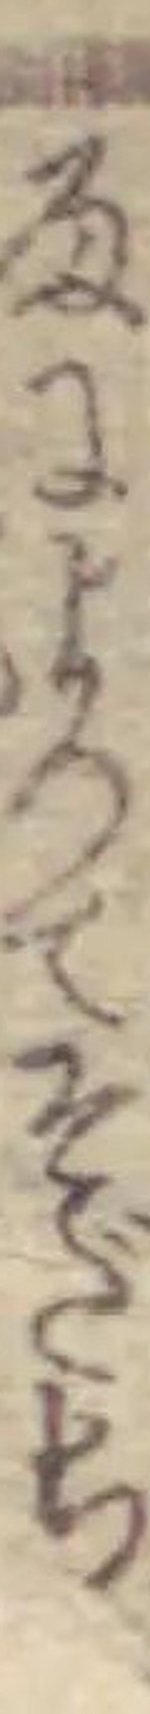雨によつてそだち
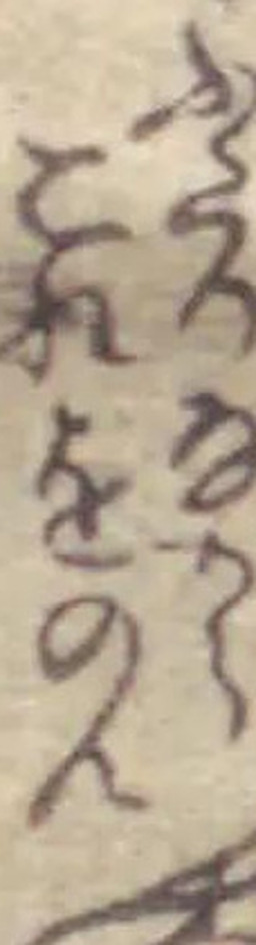これをのん
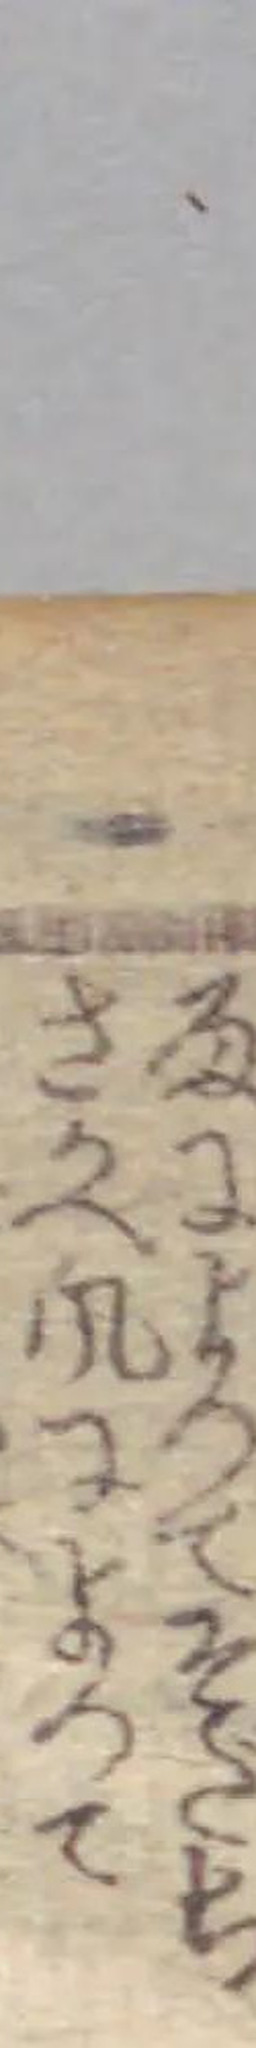さかへ風によつて
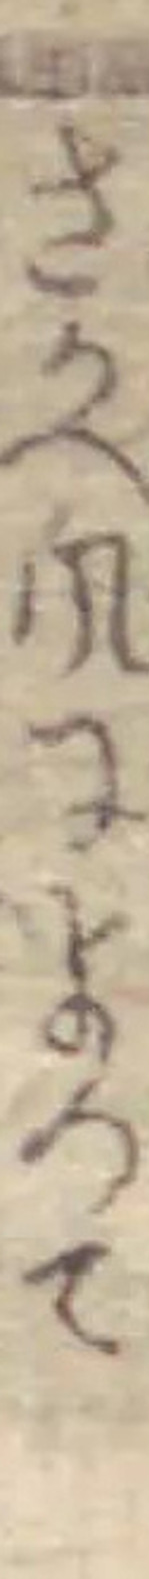さかへ風によつて
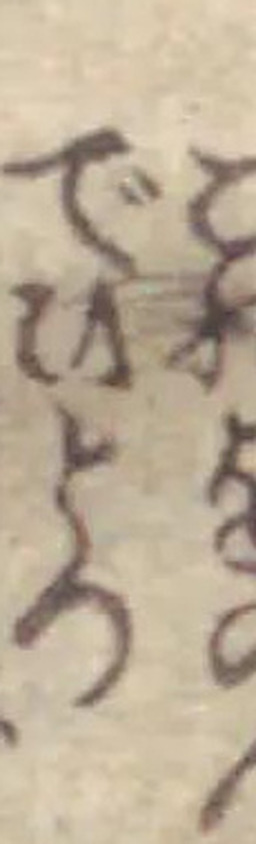でひとつ
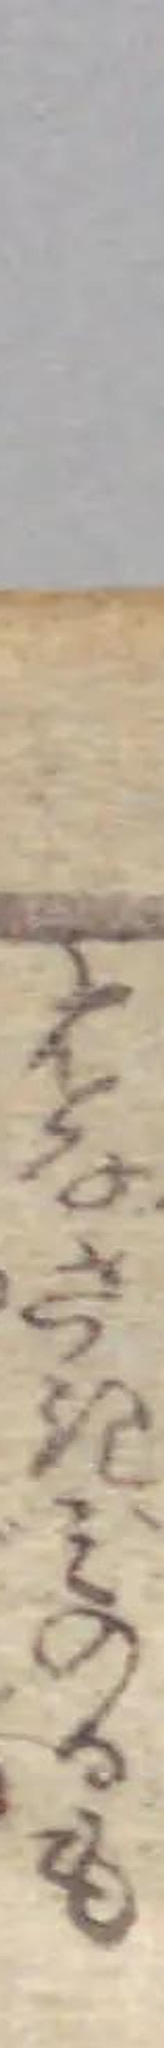はなさきみのるも
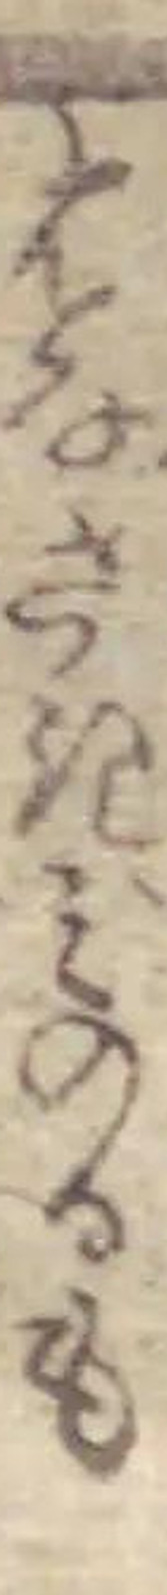はなさきみのるも
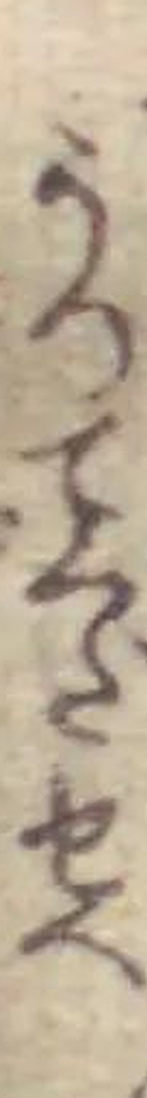うつてくだせへ
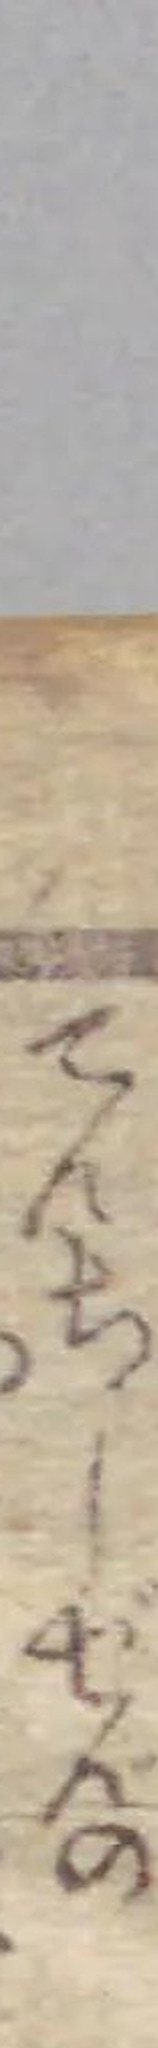てんちしぜんの
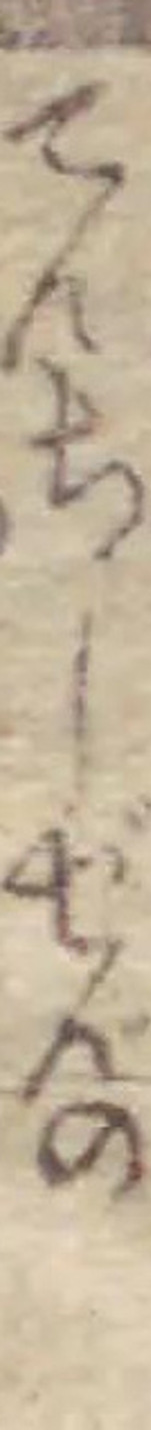てんちしぜんの
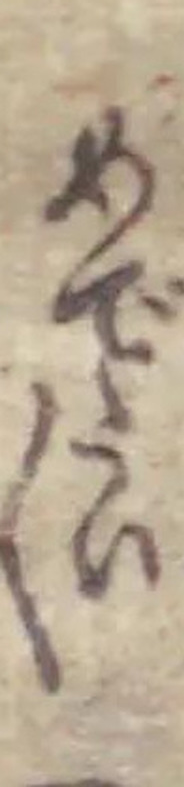めでたい
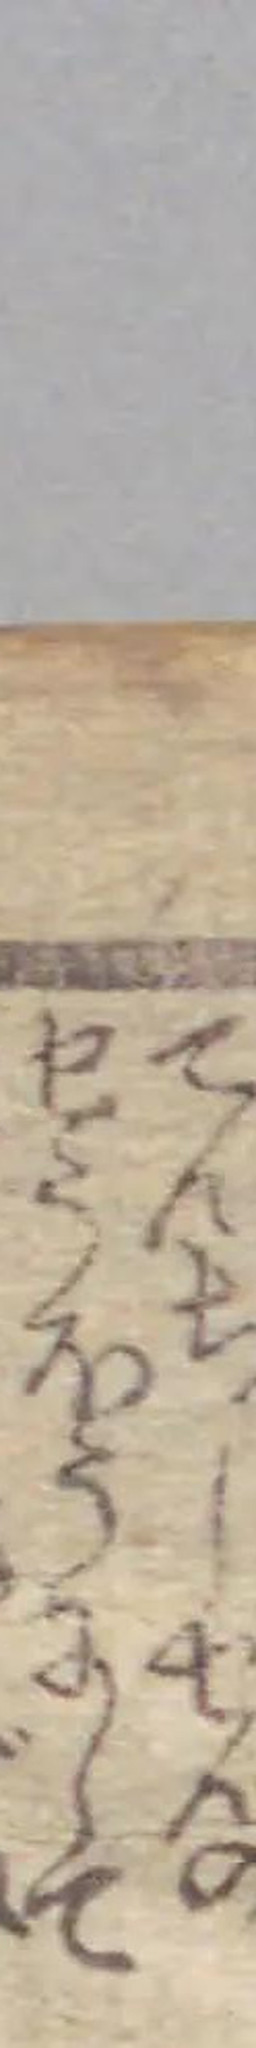せうほうにして
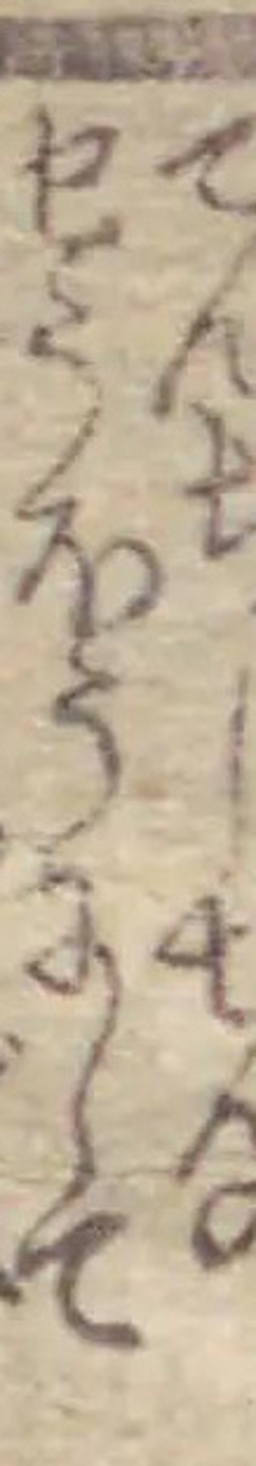せうほうにして
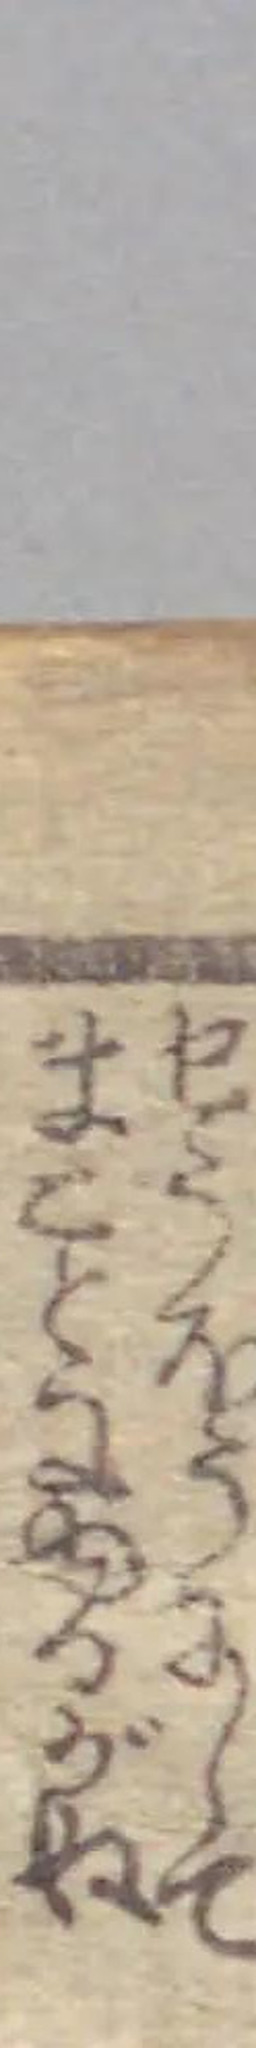まことにゆるがぬ
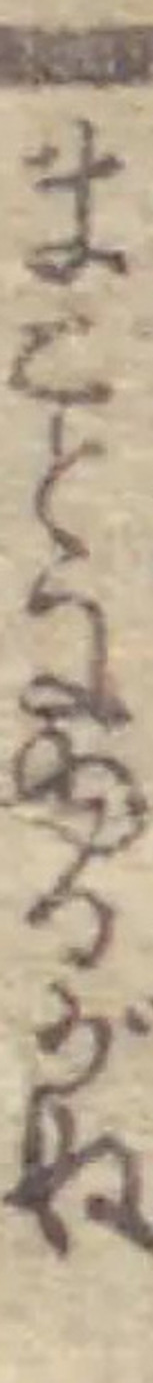まことにゆるがぬ
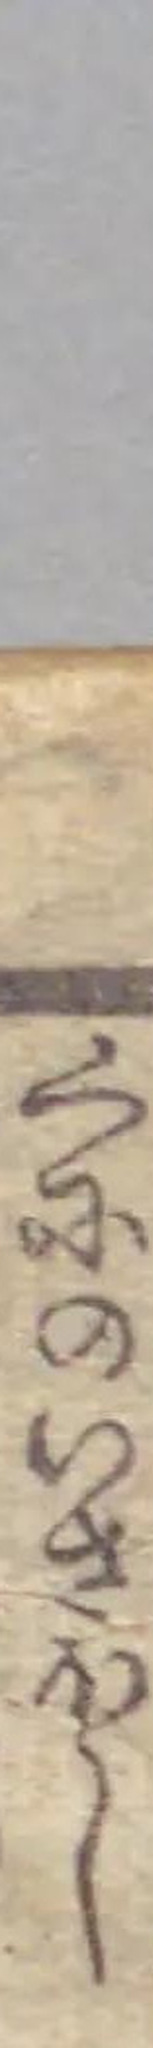くにのいさほし
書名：雨宮風宮出儘略縁記 3巻
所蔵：国立国会図書館 National Diet Library, JAPAN
